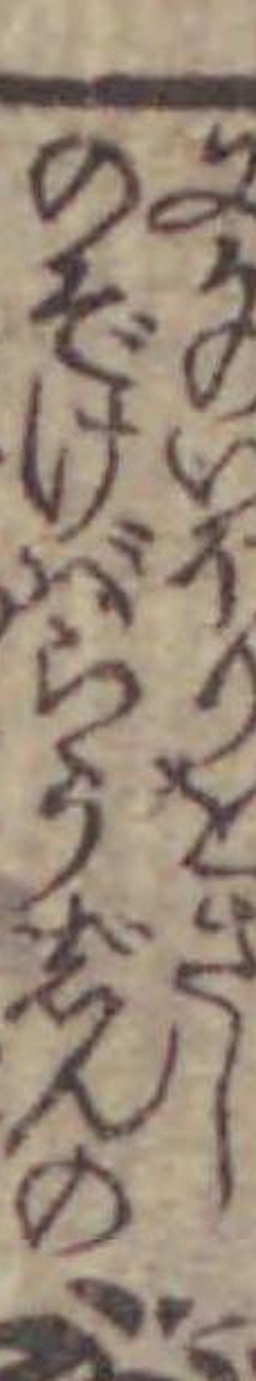のぞけばらうじんの
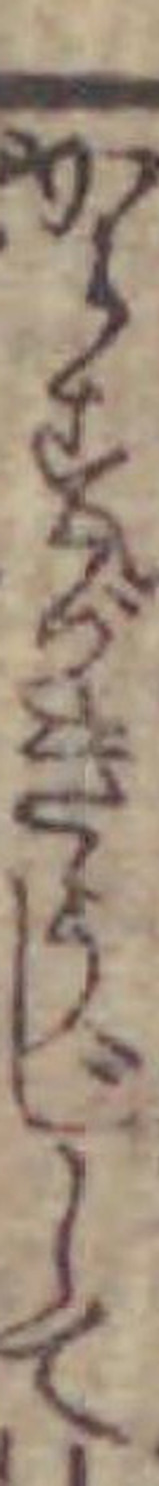からすがきうじして
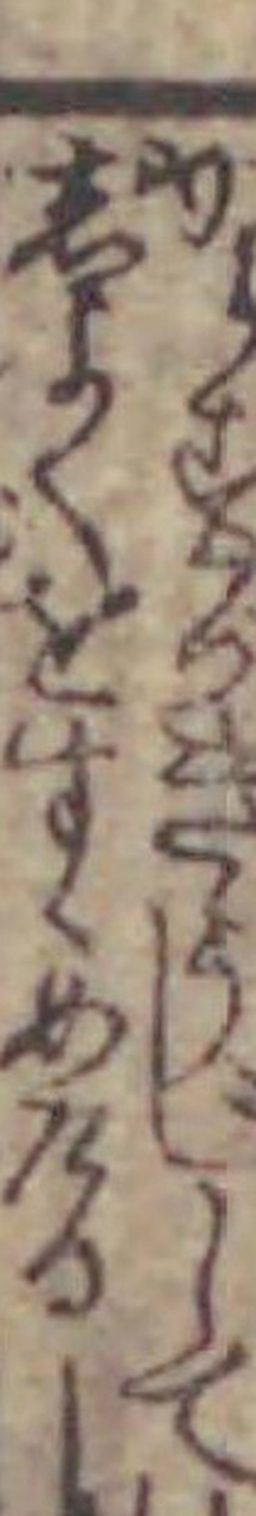しよくをすゝめける
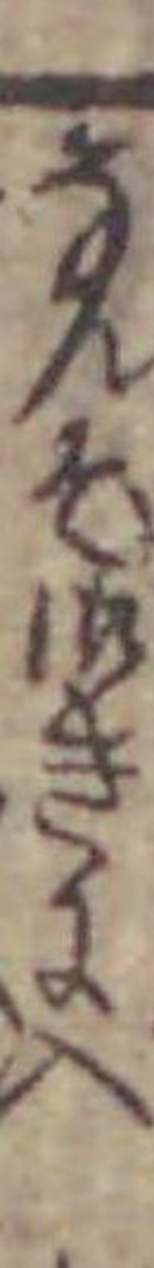なんぞ御きに入
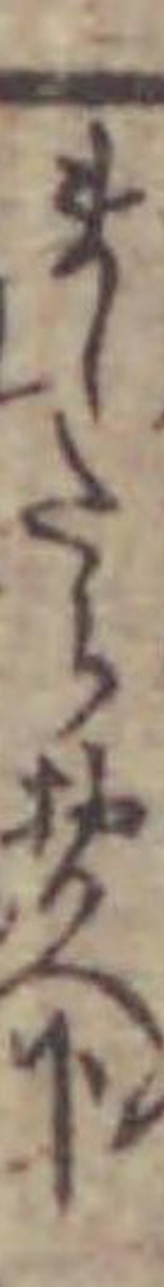ましたらおかへ下
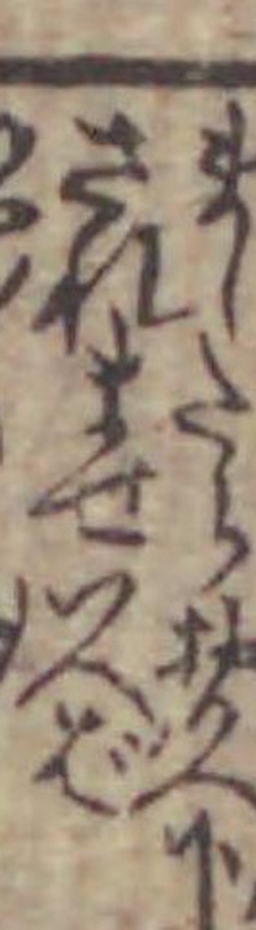されませいへば
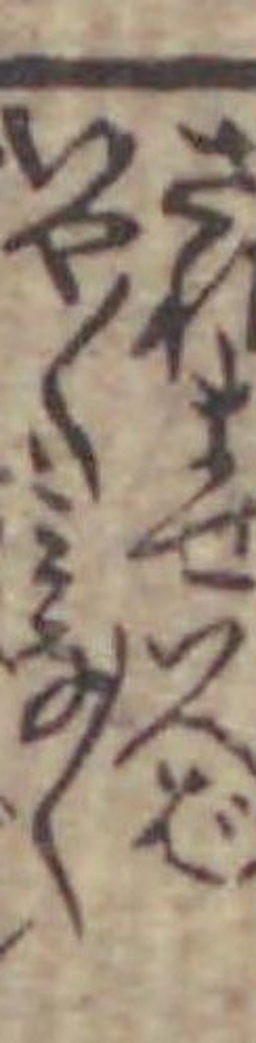いや〳〵みな〳〵
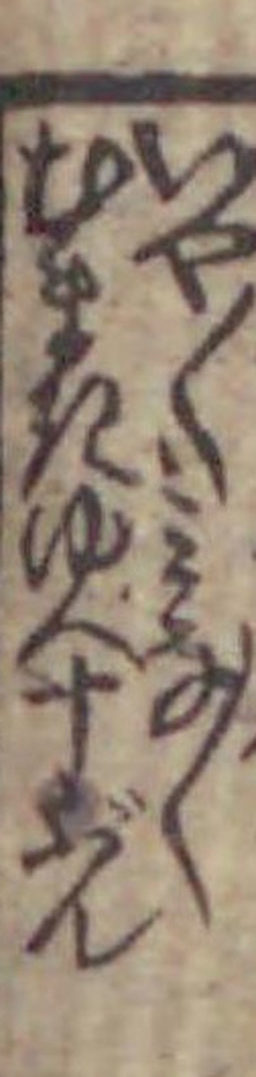むまきゆへ十ぶん
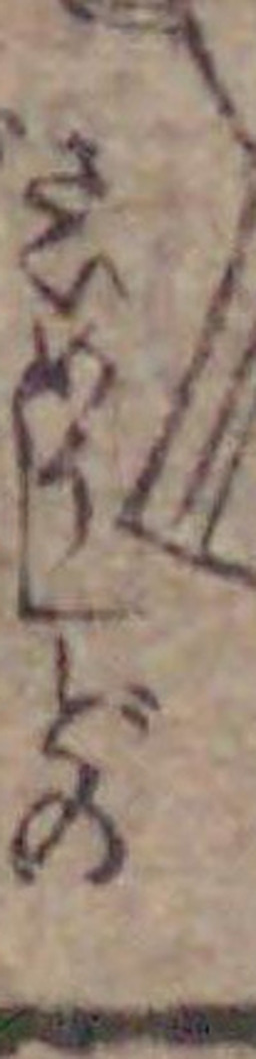さいめうしどの
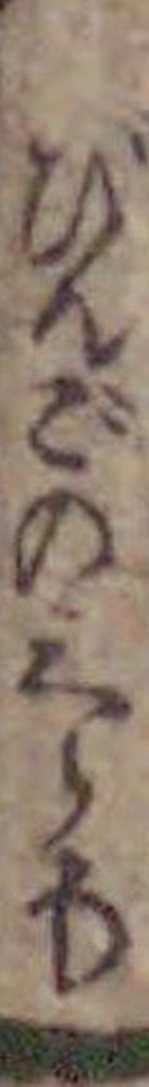びんごの三郎あ
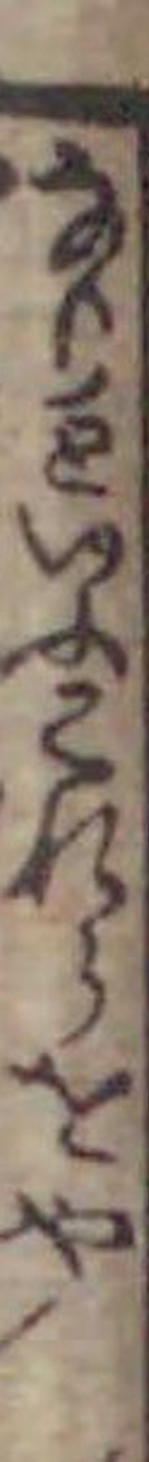なりといふこれらをや
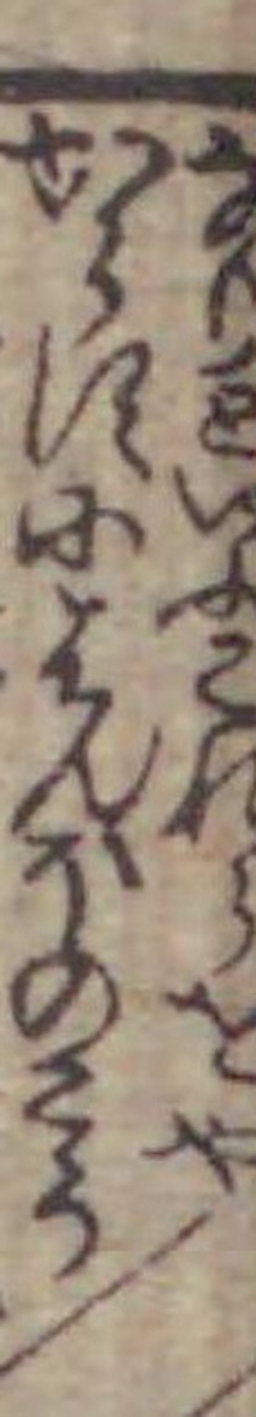からすにはんほのこう
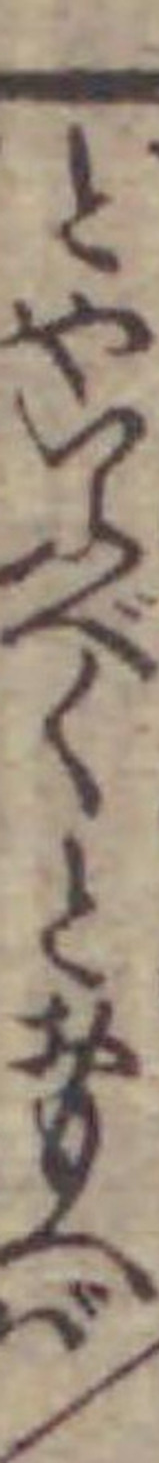とやいふべくとおもへば
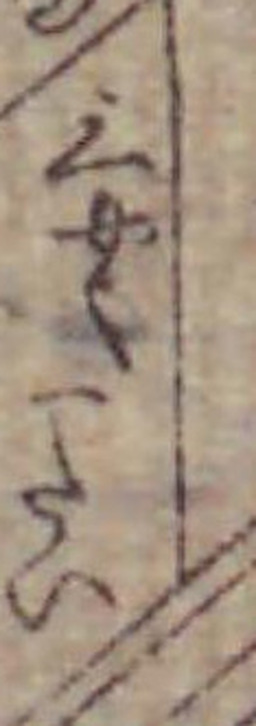三やく一たい
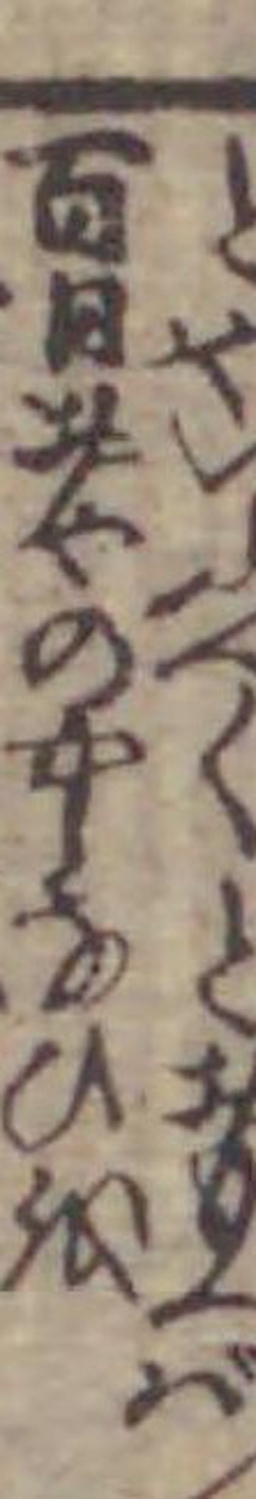百日おやの中なひを
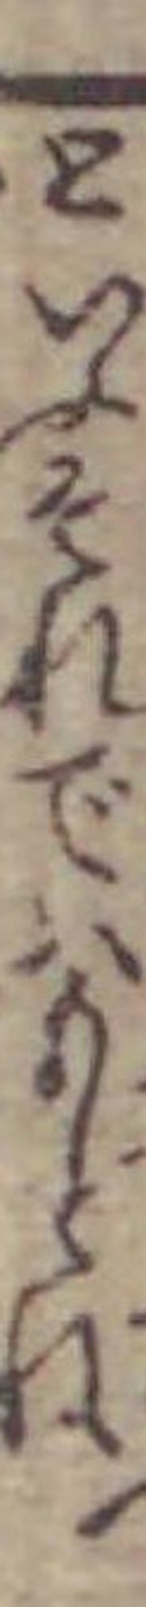といふそれではもとね
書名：即席耳学問 : 3巻
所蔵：国立国会図書館 National Diet Library, JAPAN
